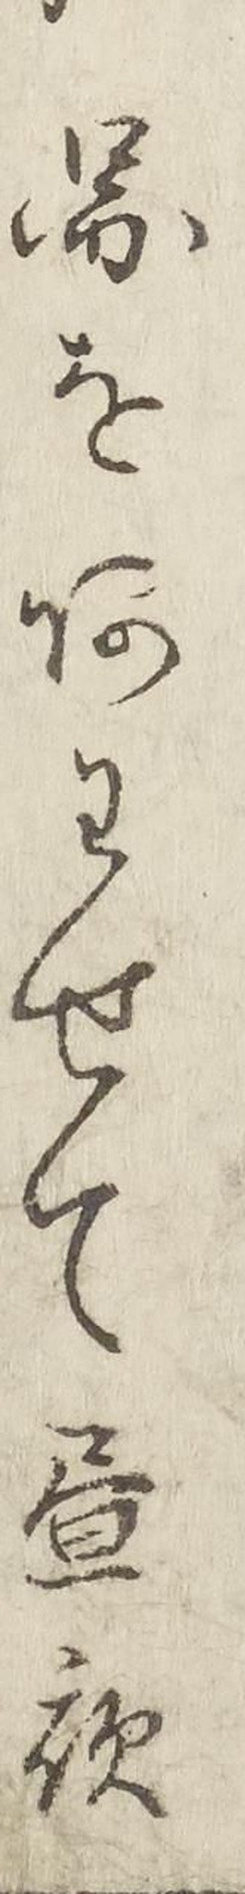図をあわせて昼夜
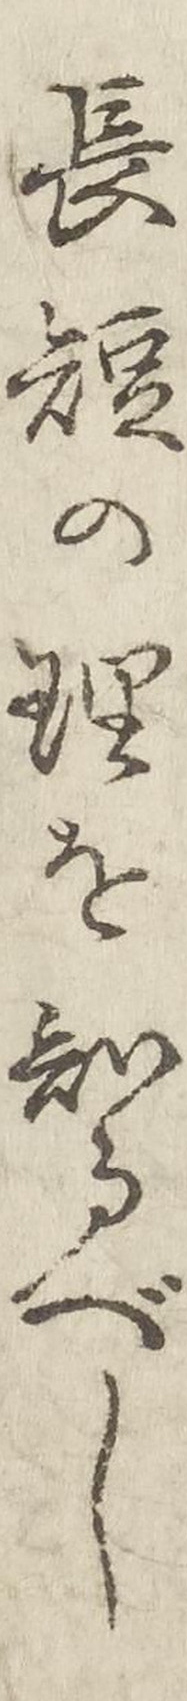長短の理を知るべし

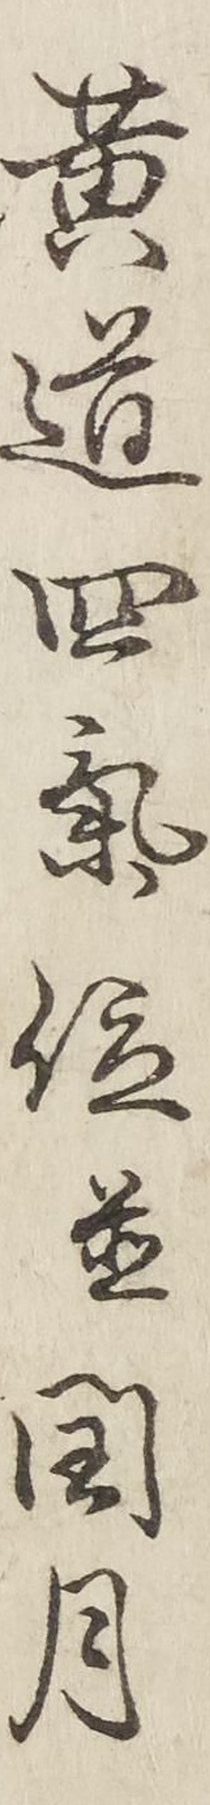横道四気位幷閏月
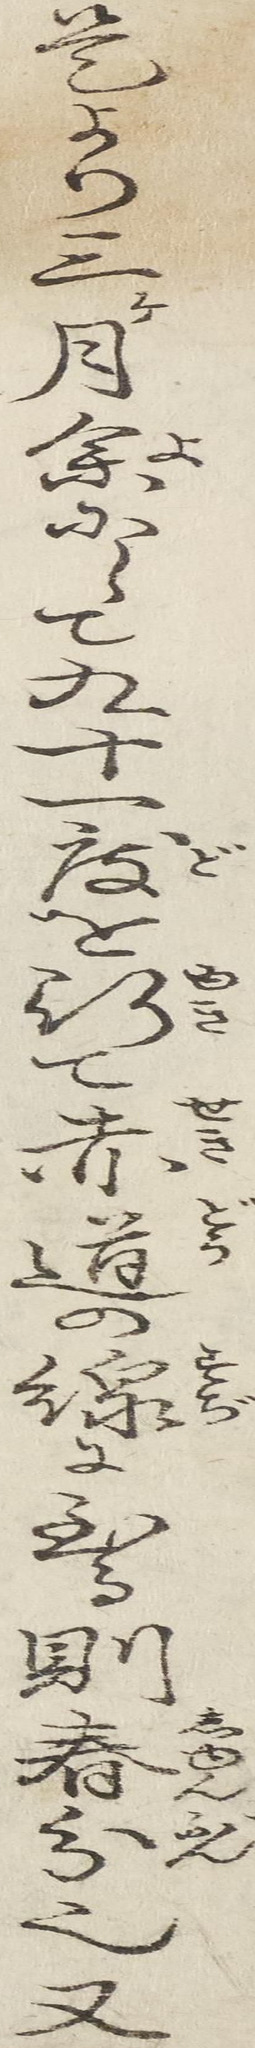是より三ヶ月余にして九十一度を行て赤道の線に至る則春分也又
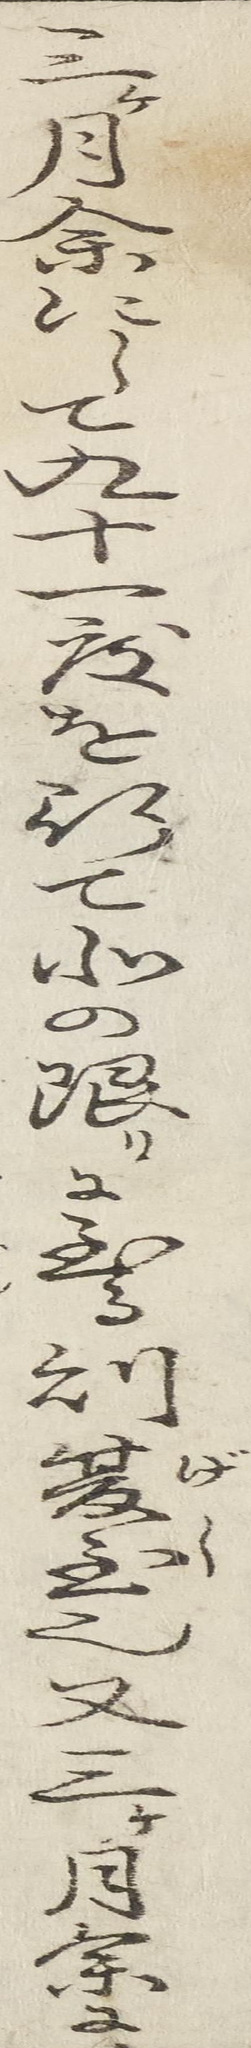三ヶ月余にして九十一度を行て北の限りに至る則夏至也又三ヶ月余に
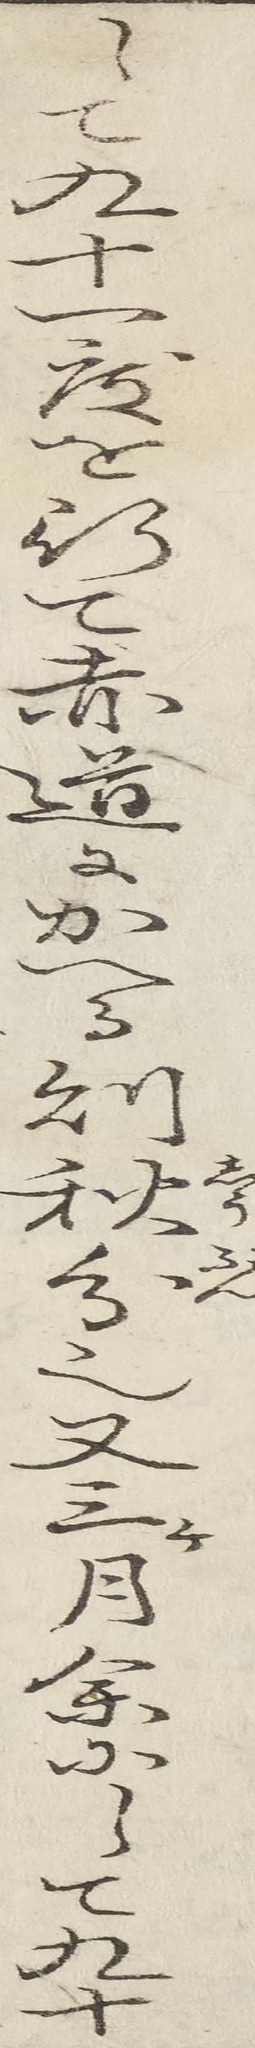して九十一度を行て赤道にかへる則秋分也又三ヶ月余にして九十
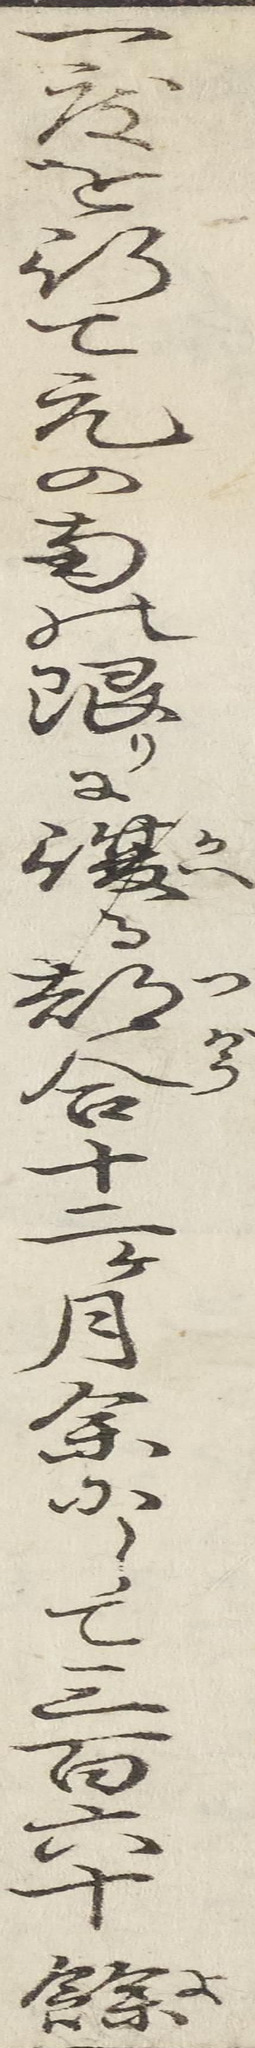一度を行て元の南の限りに復る都合十二ヶ月余にして三百六十余
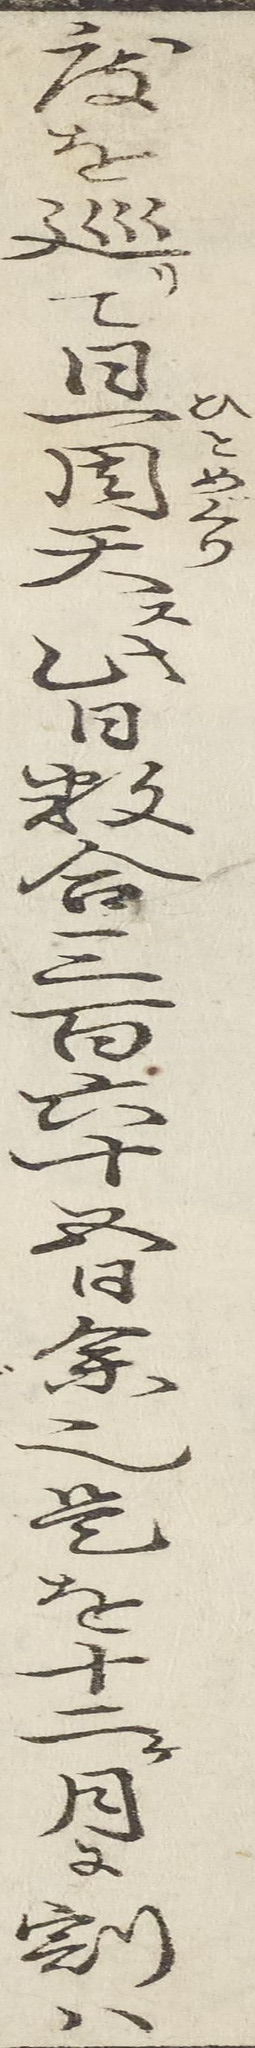度を巡りて日一周天ス此日数合三百六十五日余也是を十二ヶ月に割は
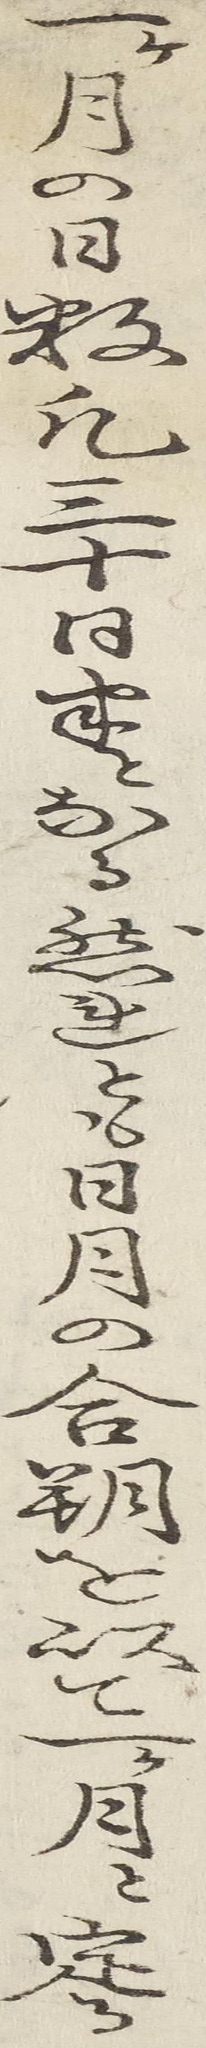一ヶ月の日数凡三十日半となる然れとも日月の合朔を以て一ヶ月と定る
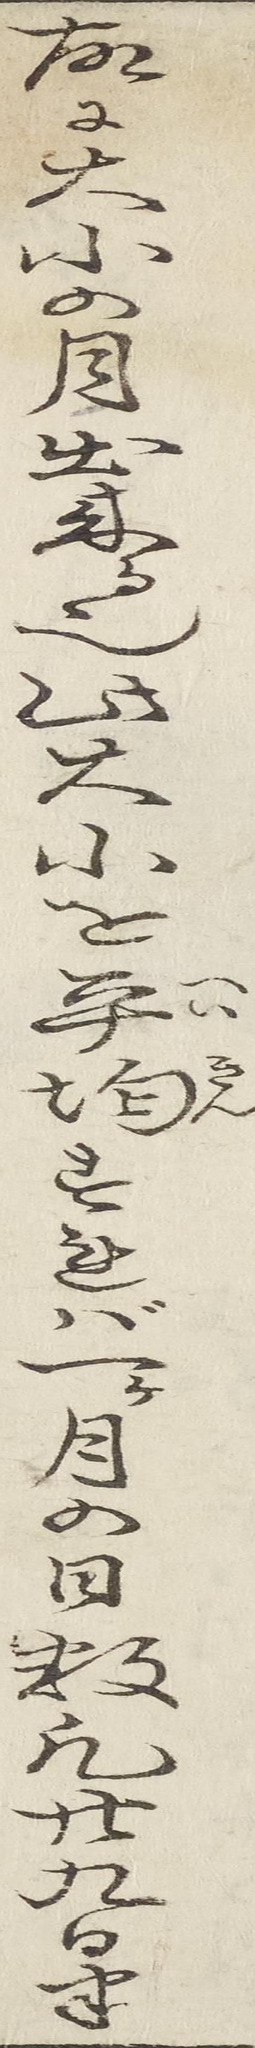故に大小の月出来る也此大小を平均すれば一ヶ月の日数凡廿九日半
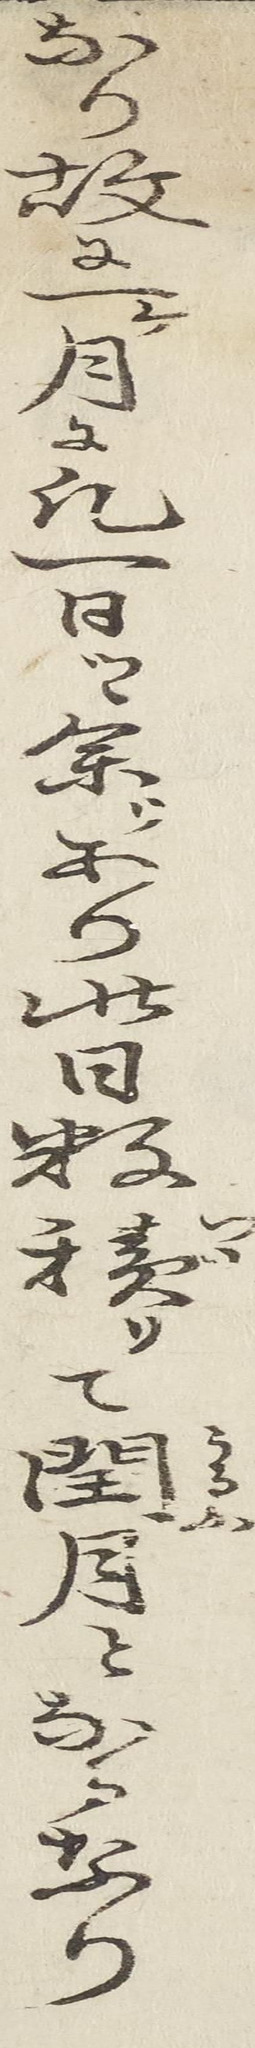なり故に一ヶ月に凡一日つゝ余りあり此日数積りて閏月となるなり
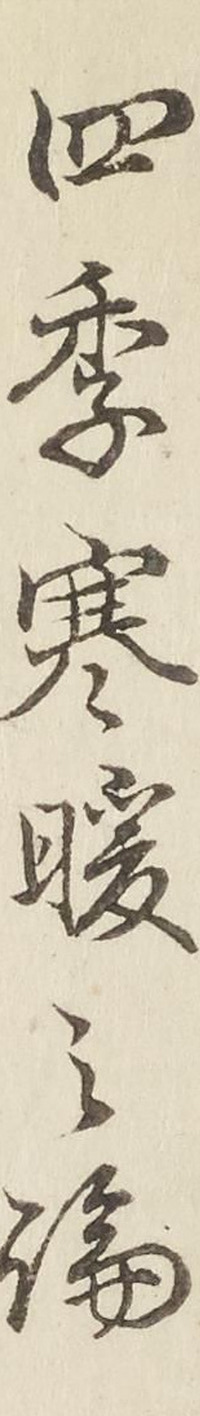四季寒暖之論
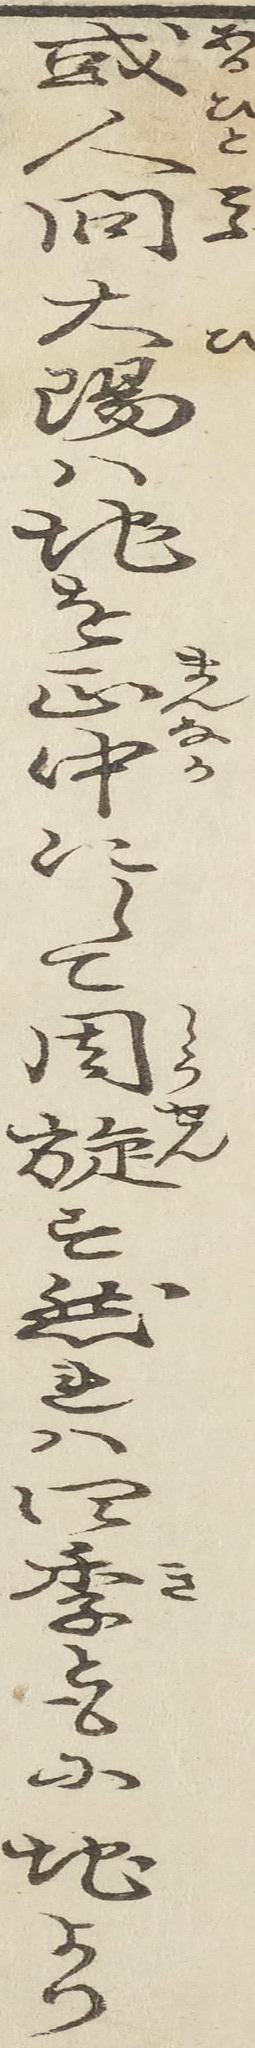或人問大陽は地を正中にして周旋す然れは四季ともに地より
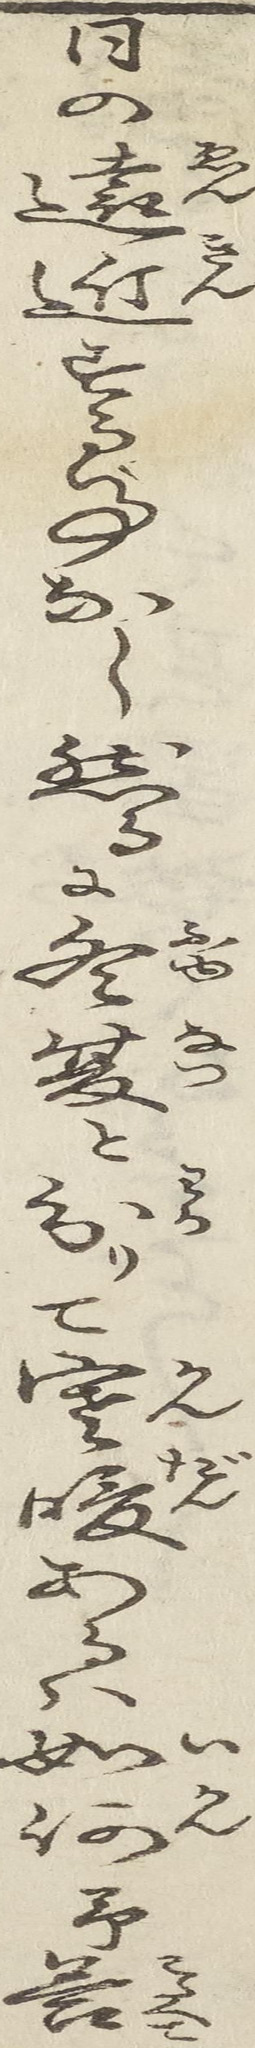日の遠近する事なし然るに冬夏と分りて寒暖あるは如何予答
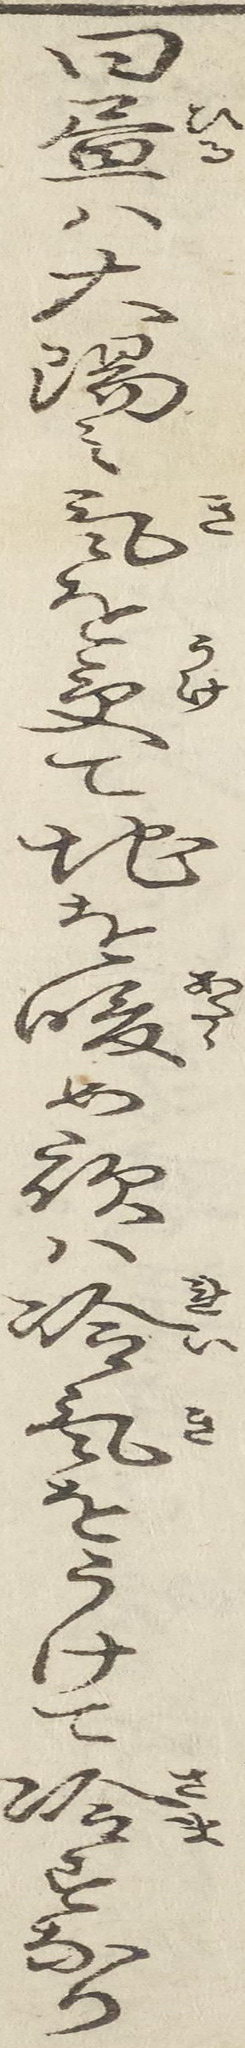曰昼は大陽之気を受て地を暖め夜は冷気をうけて冷すなり
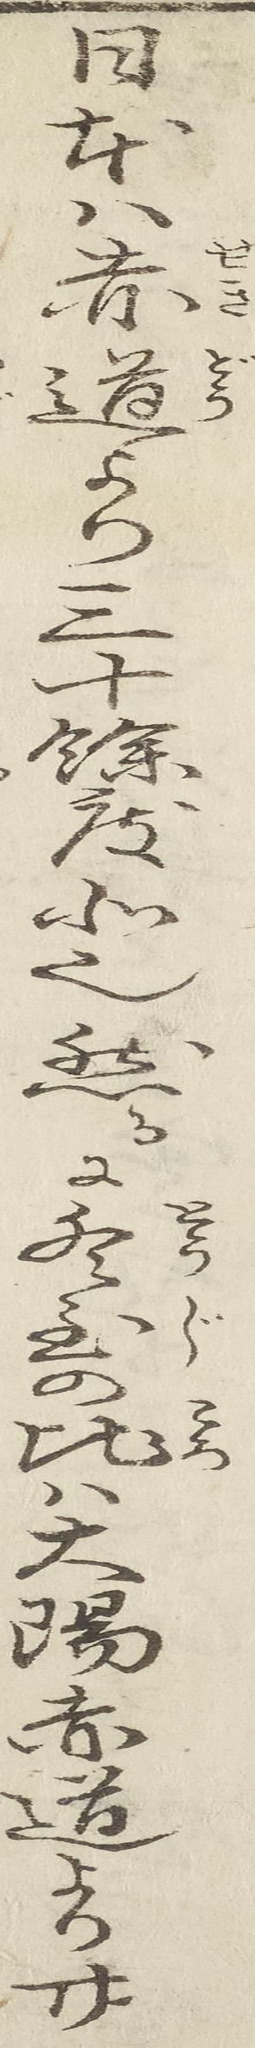日本は赤道より三十余度北也然るに冬至の比は大陽赤道より二十
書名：平天儀圖解
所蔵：東京大学地震研究所図書室 Earthquake Research Institute Library, The University of Tokyo, JAPAN
